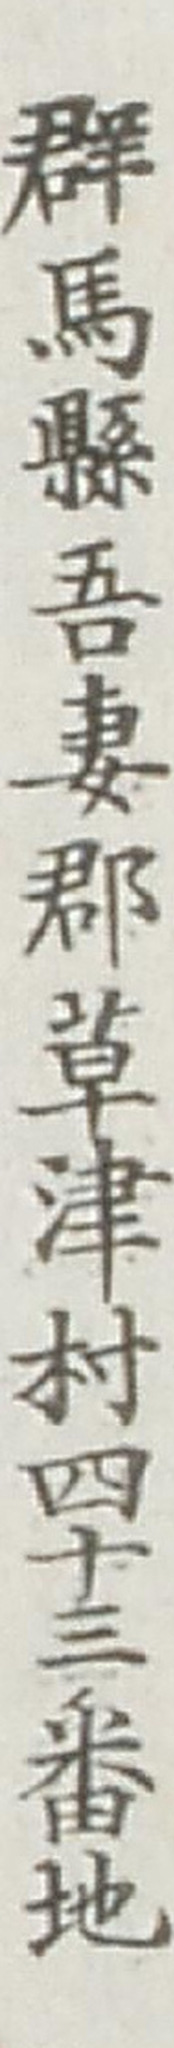群馬県吾妻郡草津村四十三番地
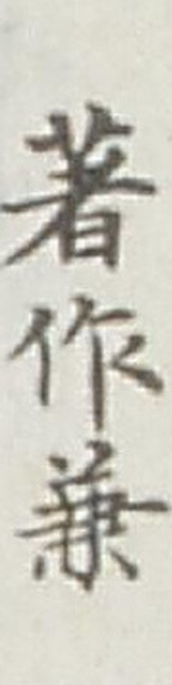著作権
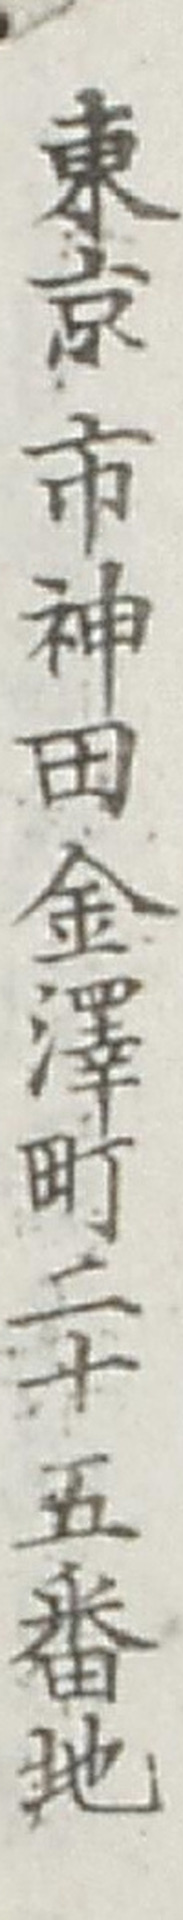東京市神田金沢町二十五番地
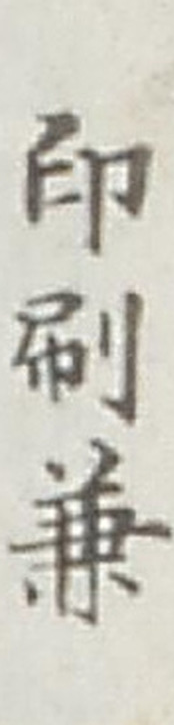印刷兼

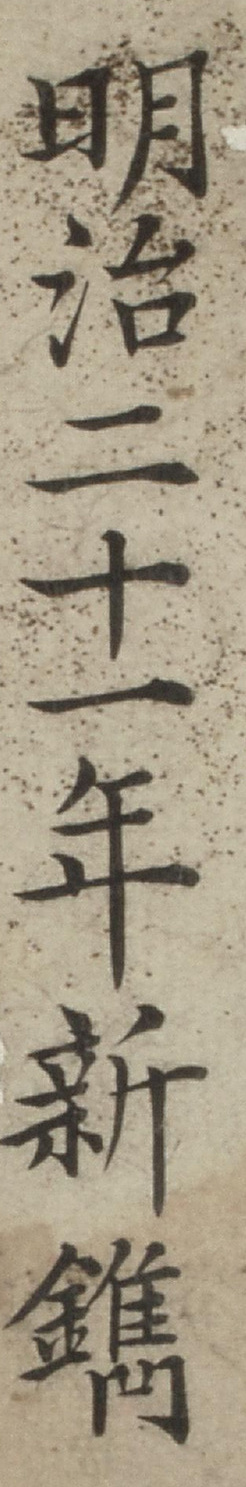明治二十一年新鐫
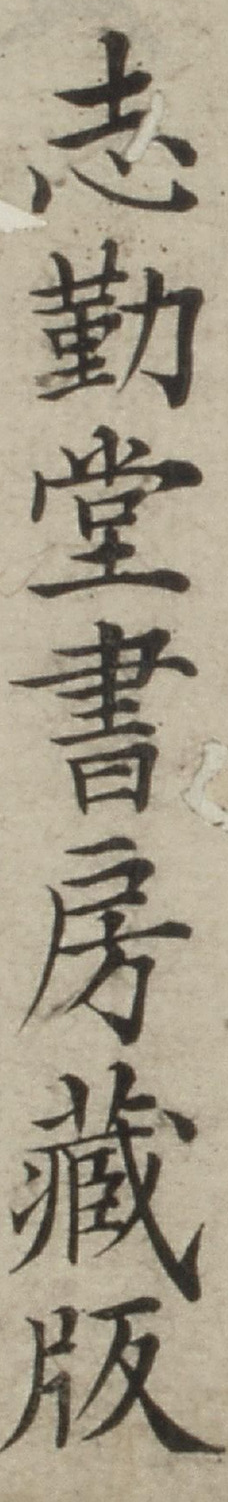志勤堂書房蔵版
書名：草津温泉誌　全
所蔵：東京大学地震研究所図書室 Earthquake Research Institute Library, The University of Tokyo, JAPAN
